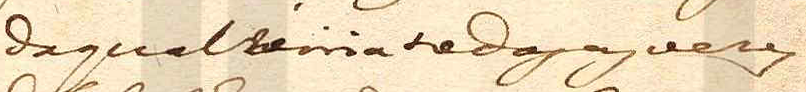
da qual tem a todas as vezes
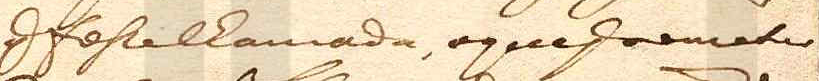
q̄ fosse chamada o que prometeo
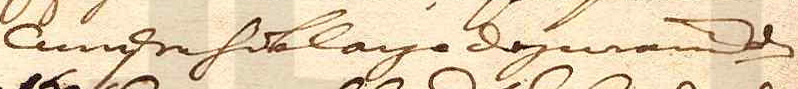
Cumprir sob Cargo do juramt do
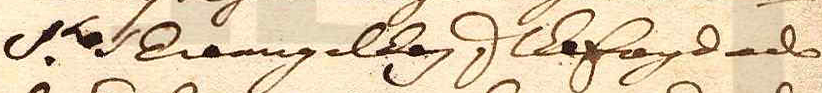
S.tos Evangelhos q̄ lhe foy dado
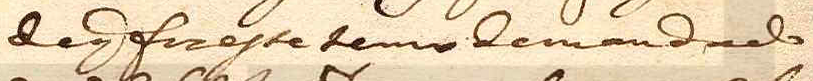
de q̄ fiz este termo de mandado
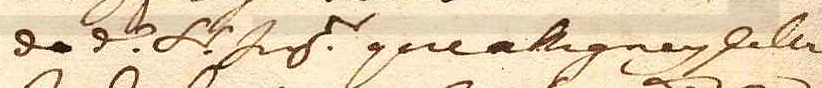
do d.o S.r Jnq.or que assigney pella
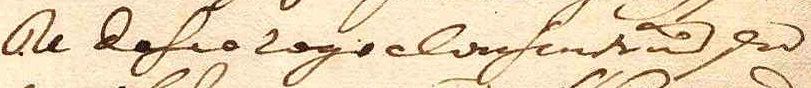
Re de seo Rogo e Consentimto por
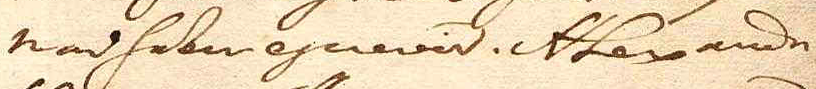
naõ saber escrever. Alexandre
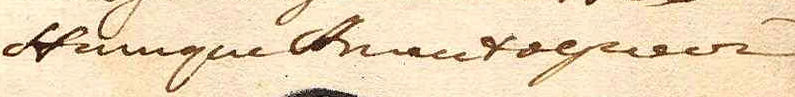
Henrique Arnaut o escrevi
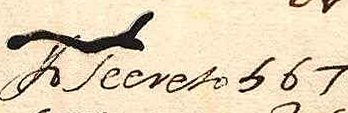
do Secreto 567
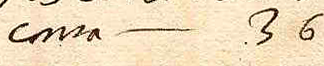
conta - 36
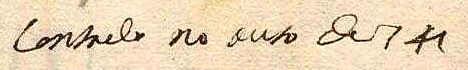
Contado no auto de 741
